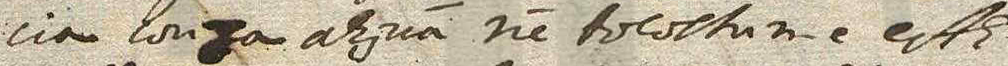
çia couza alguā nē do costume E Al
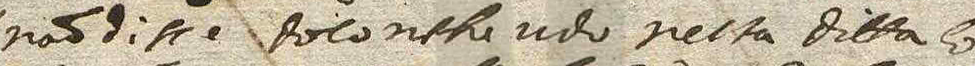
naõ disse do contheudo nesta ditta co
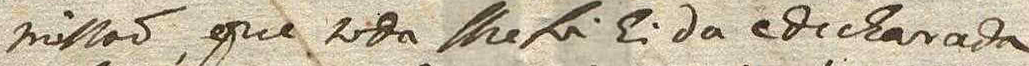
missaõ, e que toda lhe foi lida e declarada
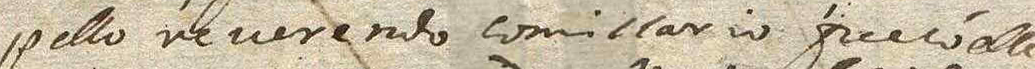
pello reuerendo comissario que cō elle
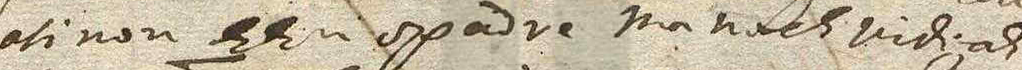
asinou E Eu o padre manoel vidigal
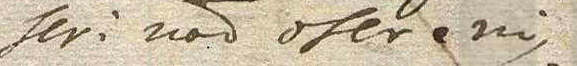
scriuão o screui.
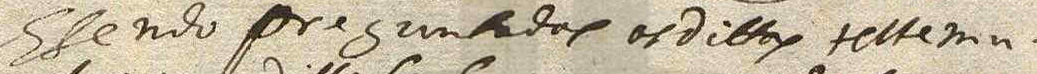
E sendo preguntadas as dittas testemu
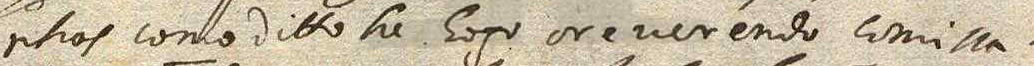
nhas como ditto he logo o reuerendo comissa
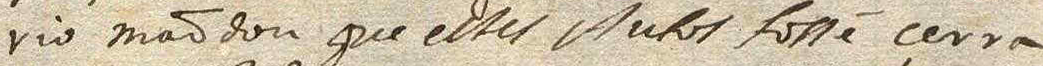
rio mãodou que estes Autos fossē çerra
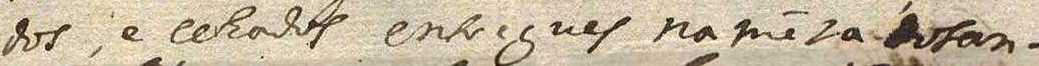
dos, e çelados entregues na mēza do san
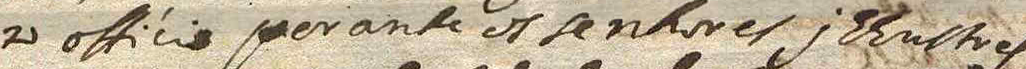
to offiçio perante os senhores jllustres
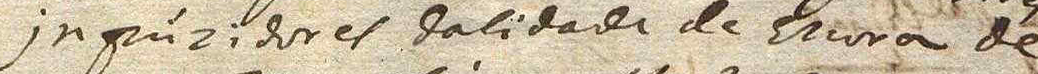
jnquizidores da çidade de Euora de
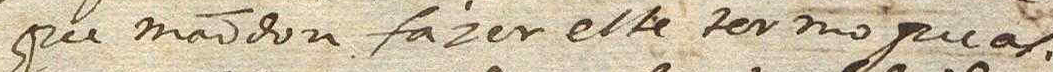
que mãodou fazer este termo que asi
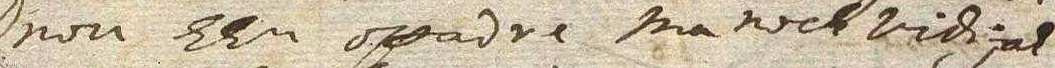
nou E Eu o padre manoel vidigal
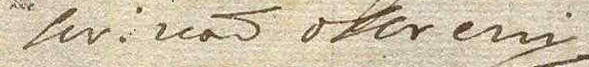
scriuão o screuy.
